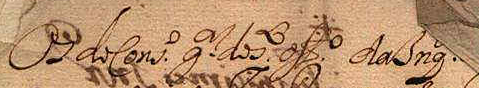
Os do Cons.o g.al do s.to off.o da Inq.
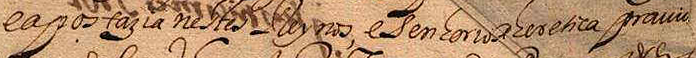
e apostazia nestes Reynos, e Senhorio_ _ a heretica prauid
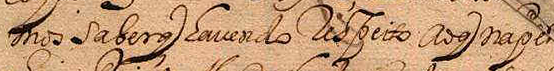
mos saber q̄ hauendo Respeito ao q̄ na pe
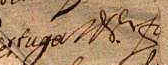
rtugal &a fa
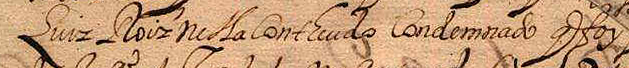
Luiz Roiz̄ nella contheudo condemnado q̄ foy
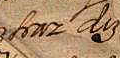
traz diz
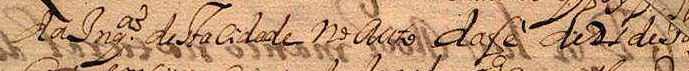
da Inq.çaõ desta cidade no Auto da fè de 21 de S
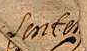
senten
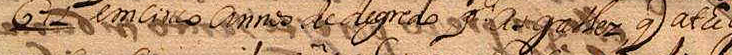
671 em cinco annos de degredo p.a as gallez q̄ athe
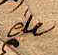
de
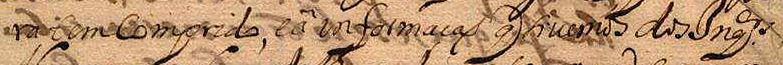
ra tem comprido, e â informaçaõ q̄ tiuemos dos Inq.ors
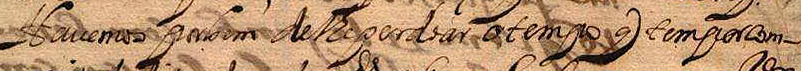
Hauemos por bem de lhe perdoar o tempo q̄ tem por com
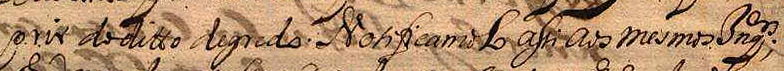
prir do ditto degredo. NotificamoLo assi aos mesmos Inqors;
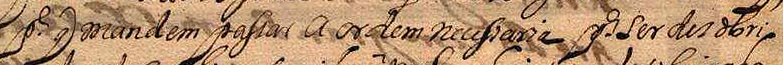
p.a q̄ mandem passar a ordem necessaria p.a ser desobri
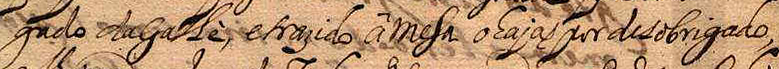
gado da Gallè, e trazido â mesa o hajaõ por desobrigado,
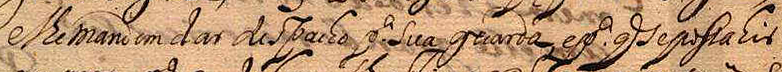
e lhe mandem dar despacho p.a sua guarda, e p.a q̄ se possa hir
